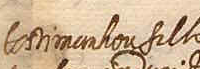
testimunhou falso
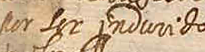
por ser induzido
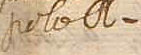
pelo R.
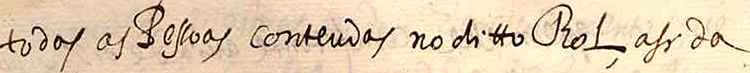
todas as Pessoas conteudas no ditto RoL, asi da
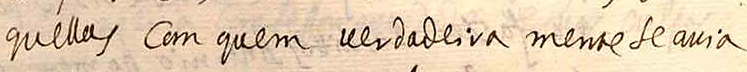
quellas com quem uerdadeiramente se auia
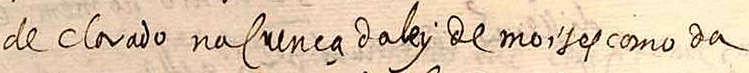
declarado na Crença da ley de moises como da
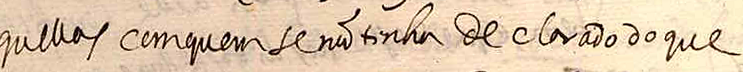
quellas com quem se nā tinha declarado do que
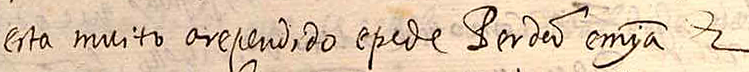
esta muito arependido e pede Perdaõ e mȳa E
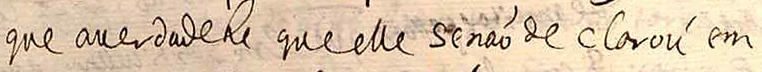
que a uerdade he que elle se naõ declarou em
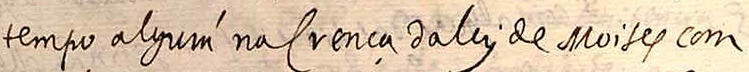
tempo algum na Crença da ley de Moises com
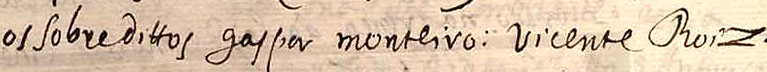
os sobredittos gaspar monteiro: vicente Roiz:
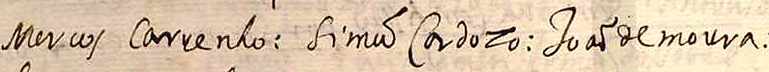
Marcos Carrenho: Simaõ Cardozo: Joaõ de moura:
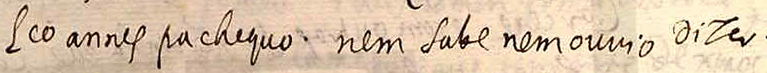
Lco annes pachequo. nem sabe nem ouuio dizer.
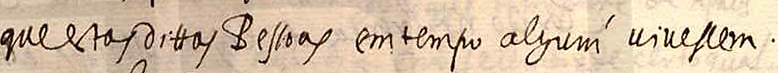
que estas dittas Pessoas em tempo algum̄ uiuessem.
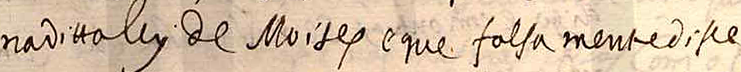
na ditta ley de Moises e que falsamente disse
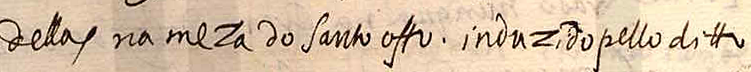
dellas na meza do Santo offo. induzido pello ditto.
